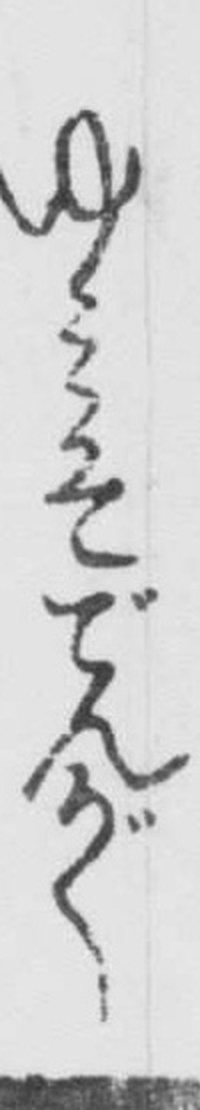ゆみそでんがく
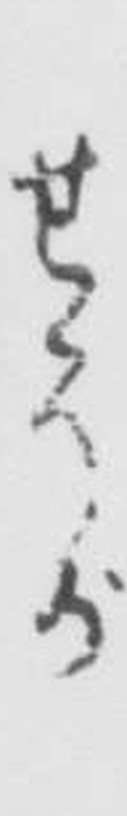せうが
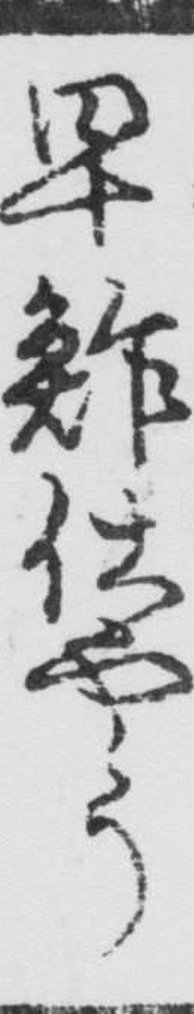早鮓仕やう
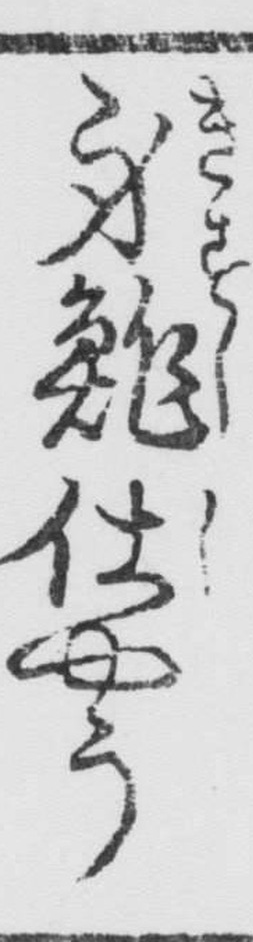身鮓仕やう
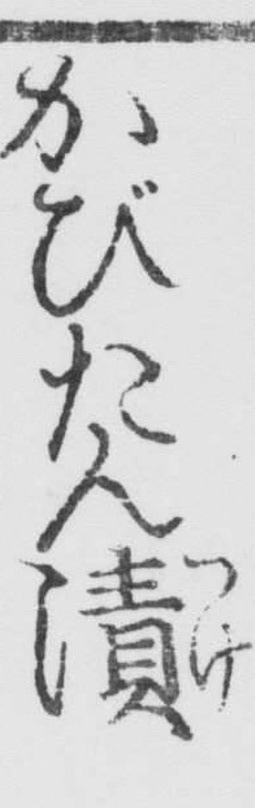かびたん漬
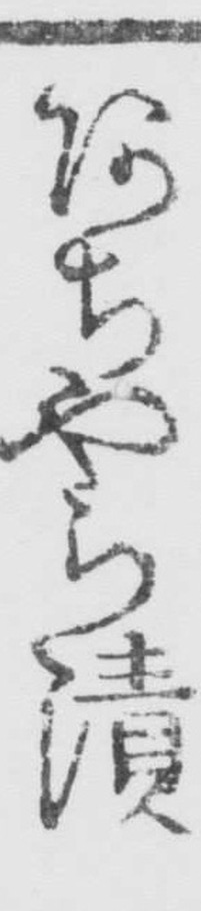あちやら漬
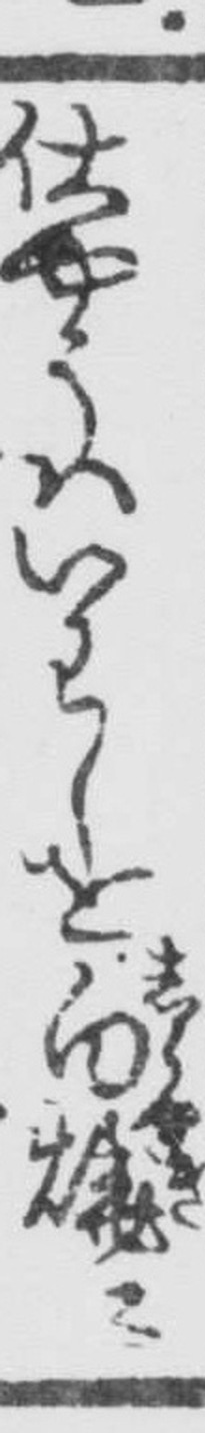仕やうはいわしを白焼に
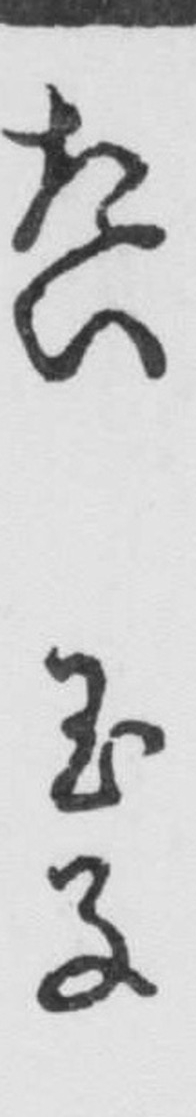たい玉子
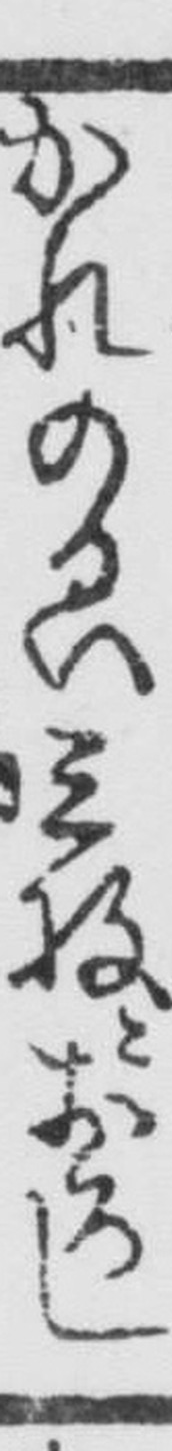かれのるい三枚におろし
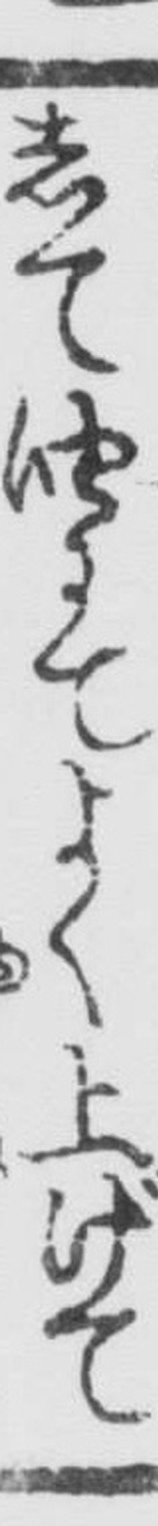して油にてよく上げて
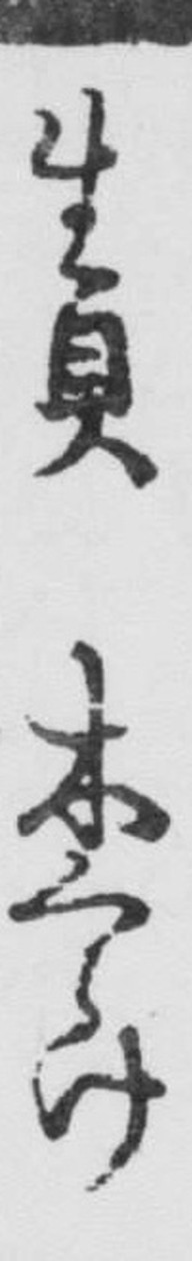生貝木くらけ
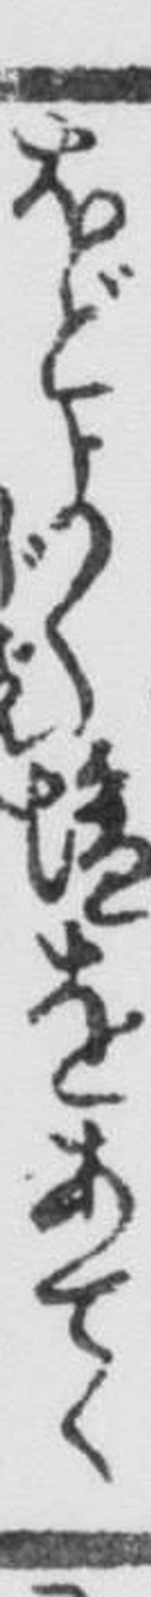ほどよく塩をあてゝ
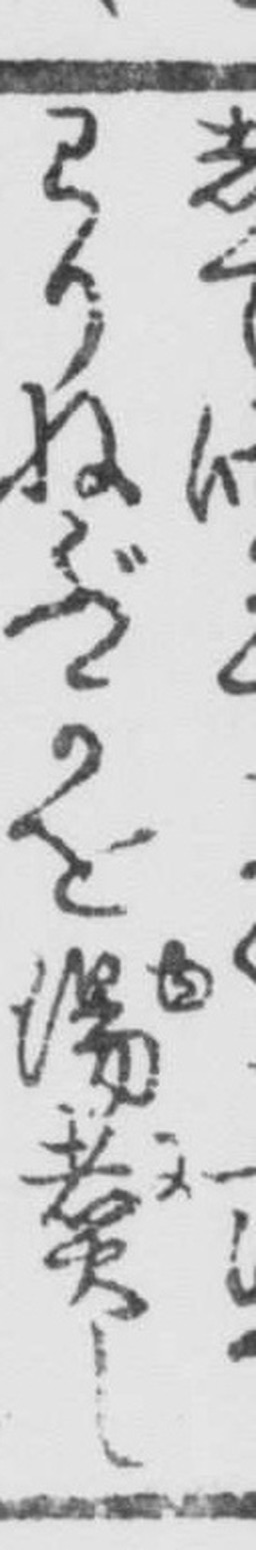わりねぶかを湯煮し
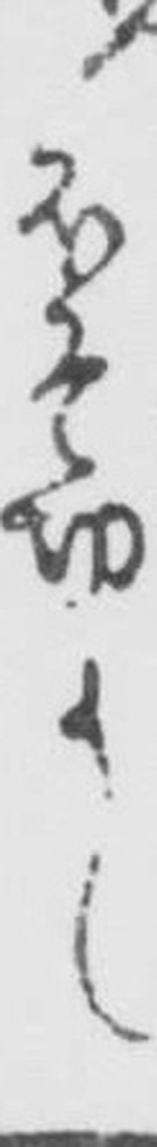ほそ切にし
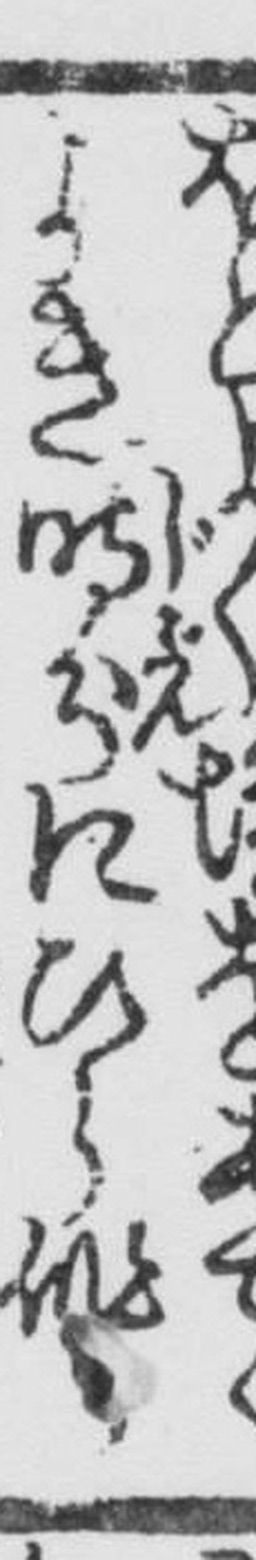よき時分にひら作
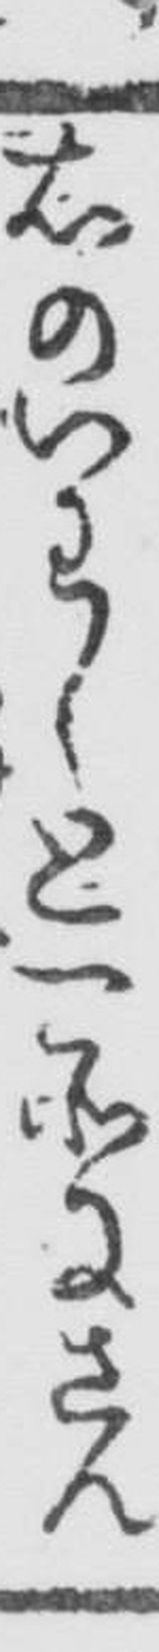右のいわしと一品にさん
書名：諸家通用/即席料理
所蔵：大阪府立大学学術情報センター 国文学研究資料館
